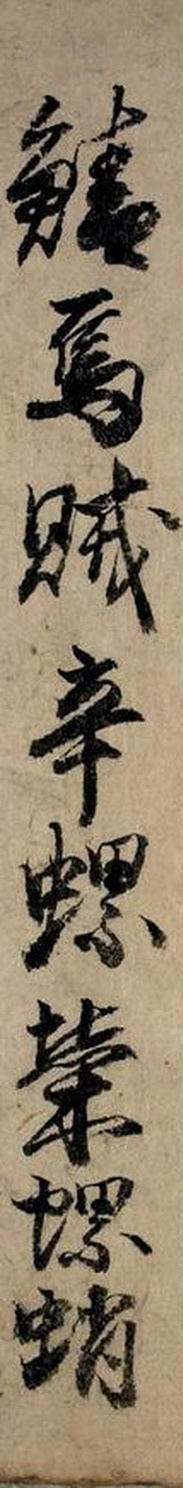鯖烏賊辛螺柴螺蛸

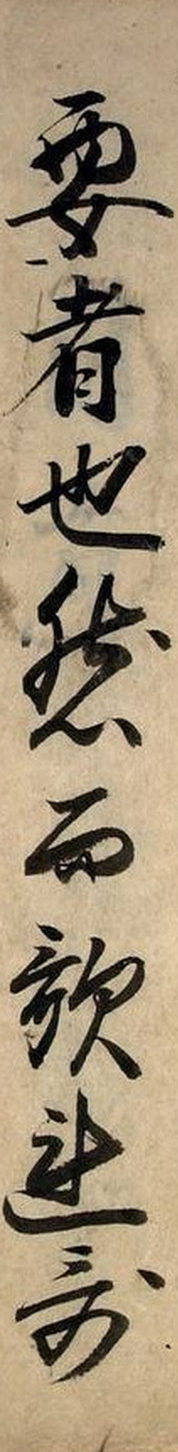要者也然而歌途寄
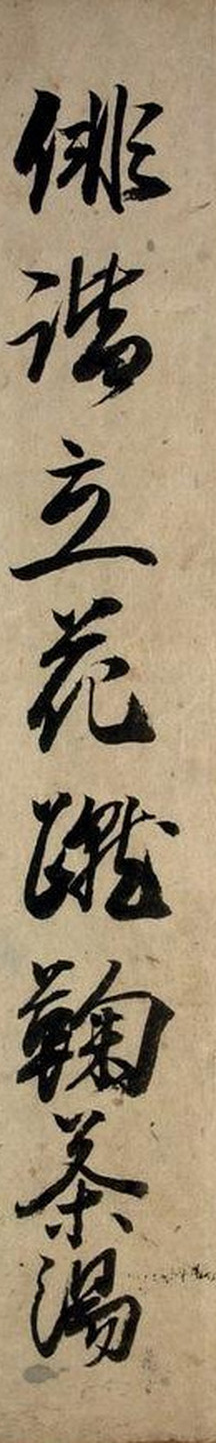俳諧立花蹴鞠茶湯
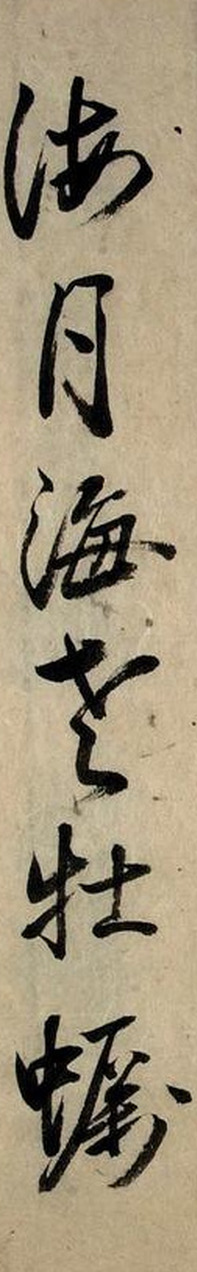海月海老牡蠣
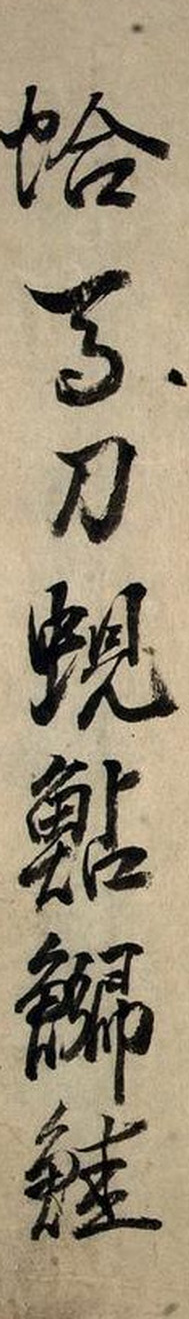蛤馬刀蜆鮎鰤鮭

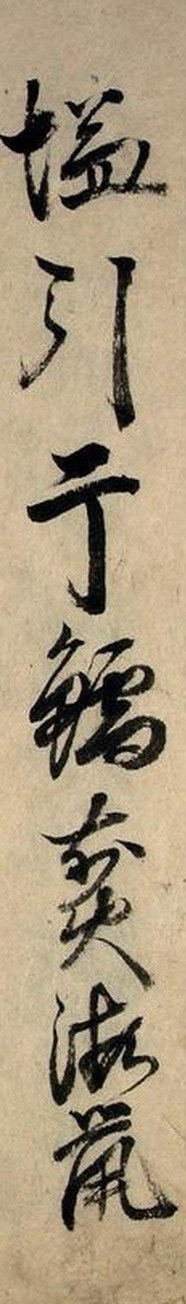塩引干鱈煎海鼠
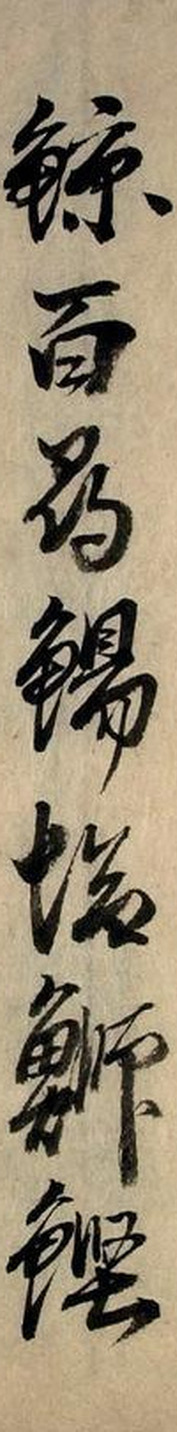鯨百尋鯣塩鰤鰹
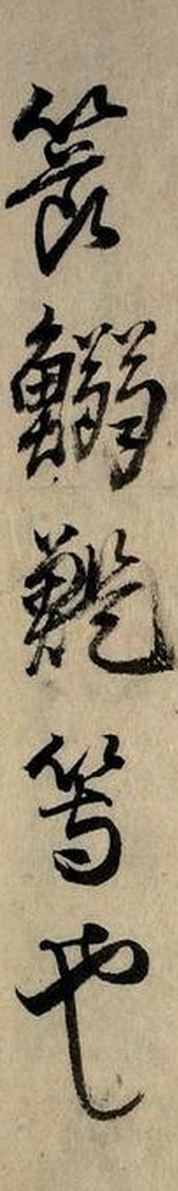節鰯鯷等也

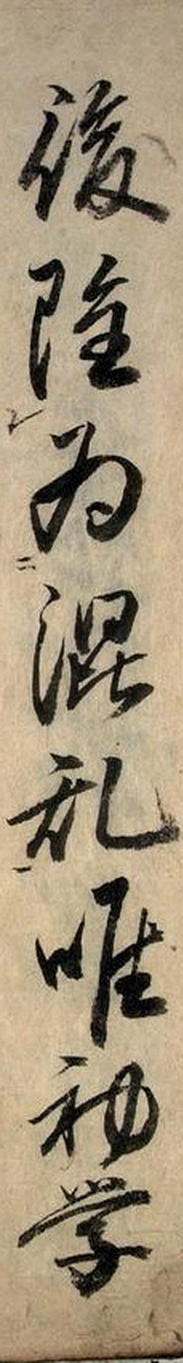後陰為混乱唯初学
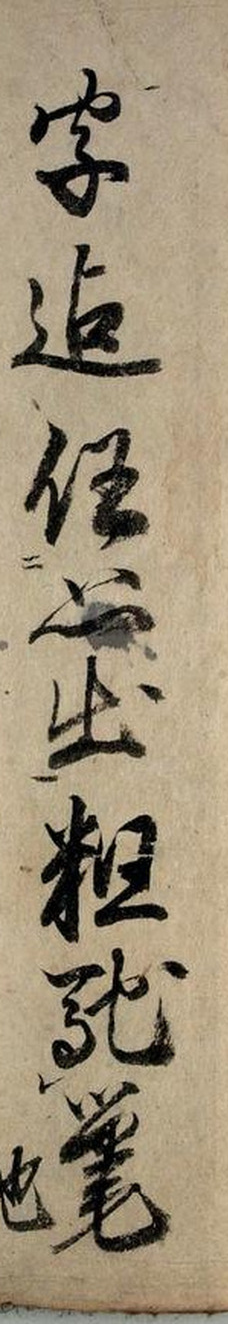字迄任心出粗馳筆也

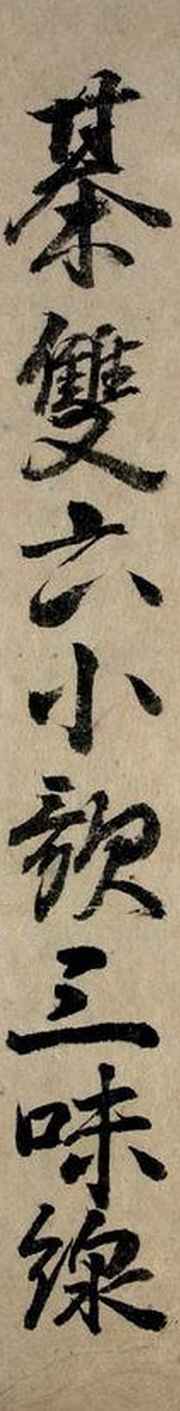基雙六小歌三味線
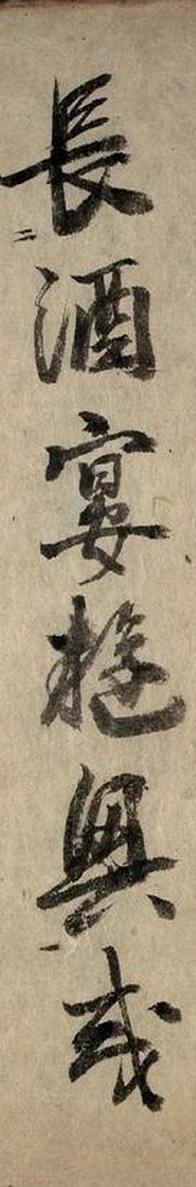長酒宴遊具或
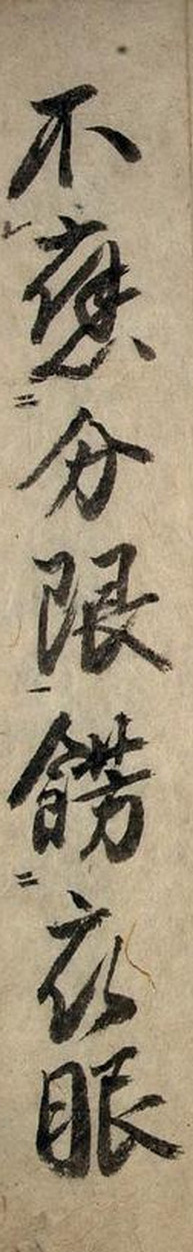不応分限錺衣眼

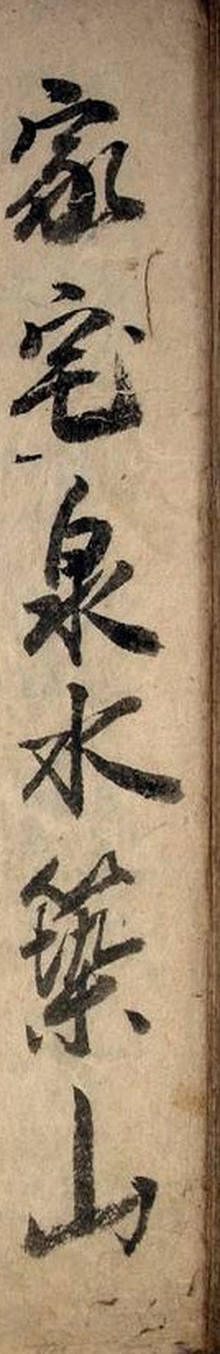家宅泉水築山
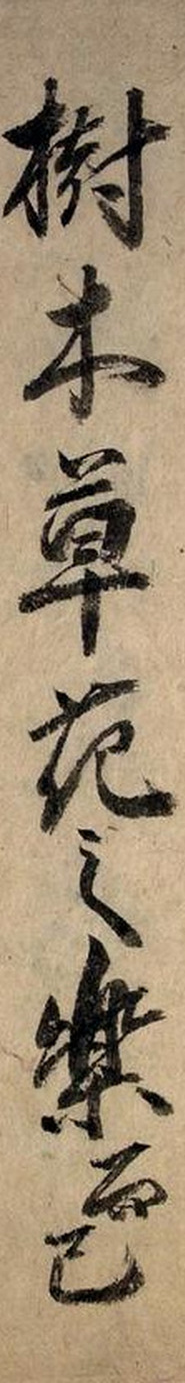樹木草花之楽而己
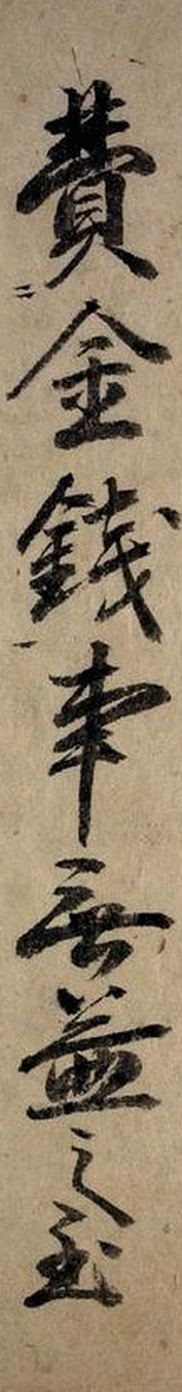費金銭事無益之至
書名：商売往来（往来物、手習）
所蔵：福井県文書館 Fukui Prefectural Archives
